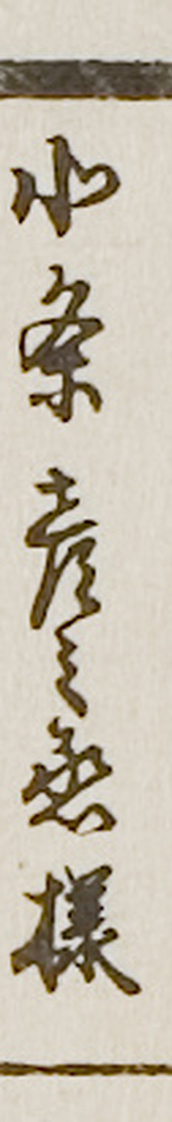北条彦之丞様
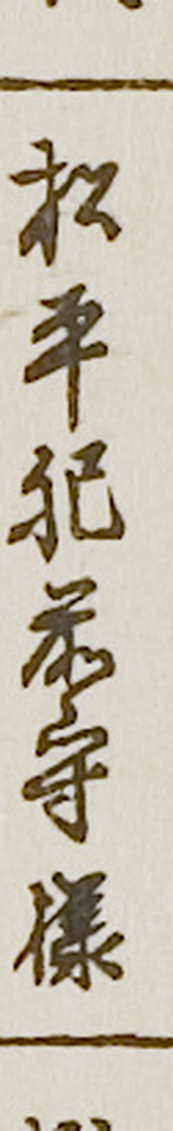松平肥前守様
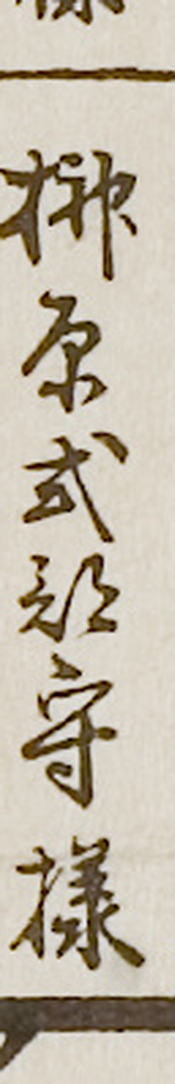榊原式部守様
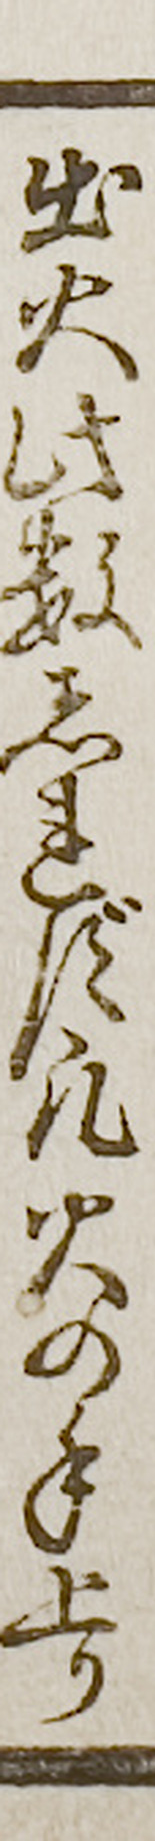出火此数しれず凡火の手上り
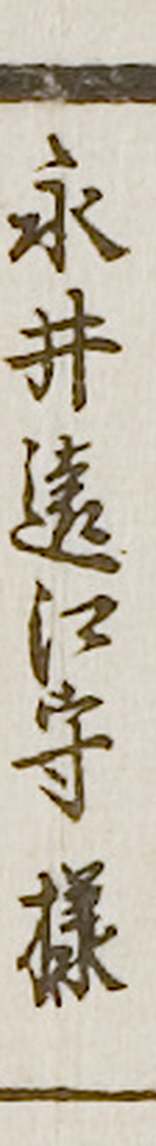永井遠江守様
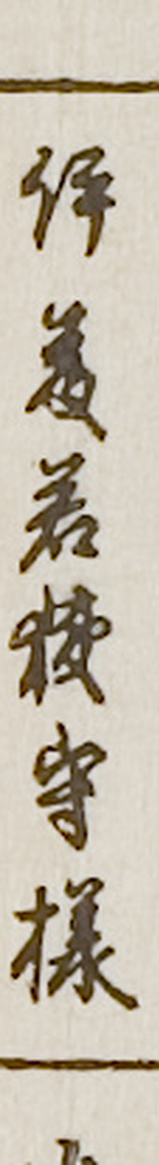伊藤若狭守様
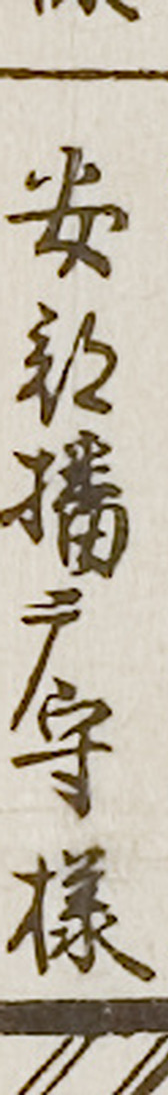安部播磨守様
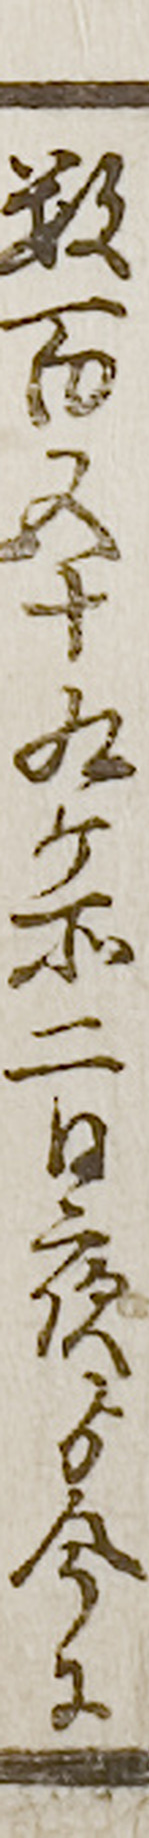数百五十九ヶ所二日夜より今に
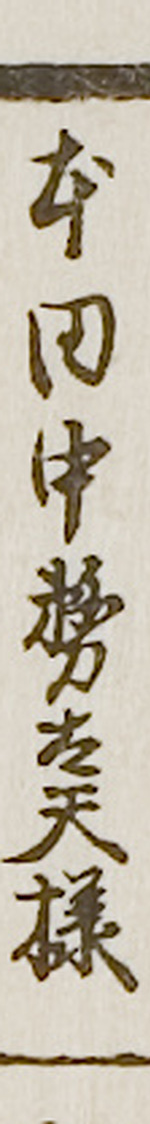本田中務太夫様
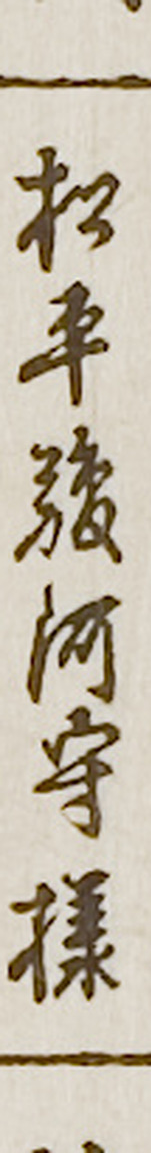松平駿河守様
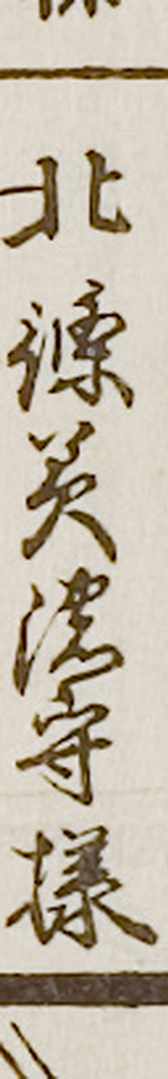北條美濃守様
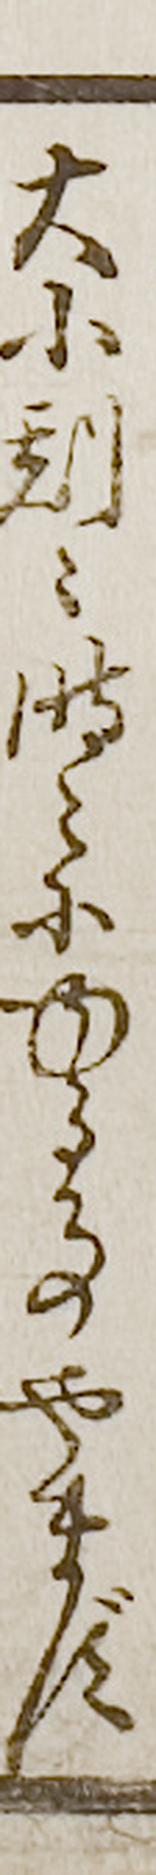大小刻々時々にゆる事やまず
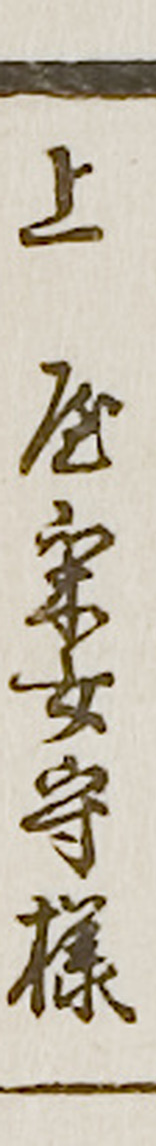土屋采女守様
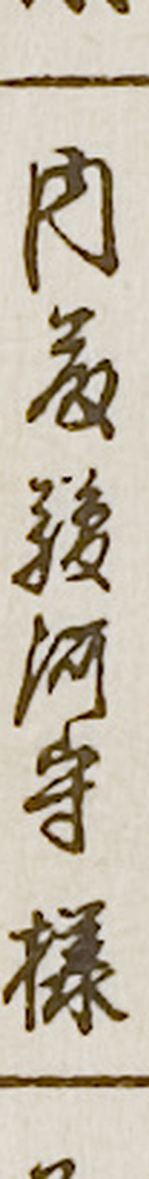内藤駿河守様
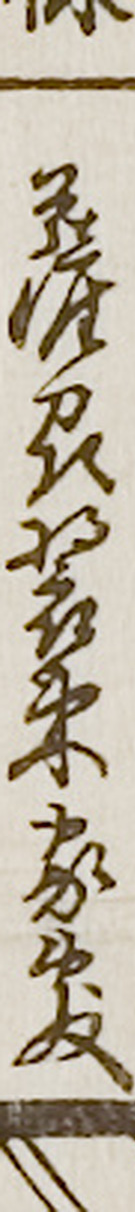薩州装束家敷
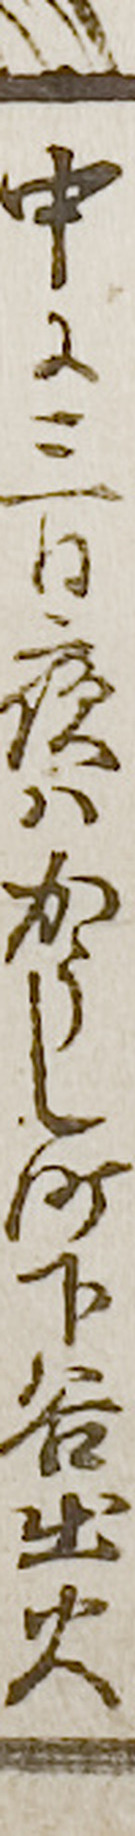中に三日夜ハかうし町下谷出火
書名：安政二乙卯歳十月二日夜ル四ツ時震始メ末代
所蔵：東京大学総合図書館 General Library in the University of Tokyo, JAPAN
